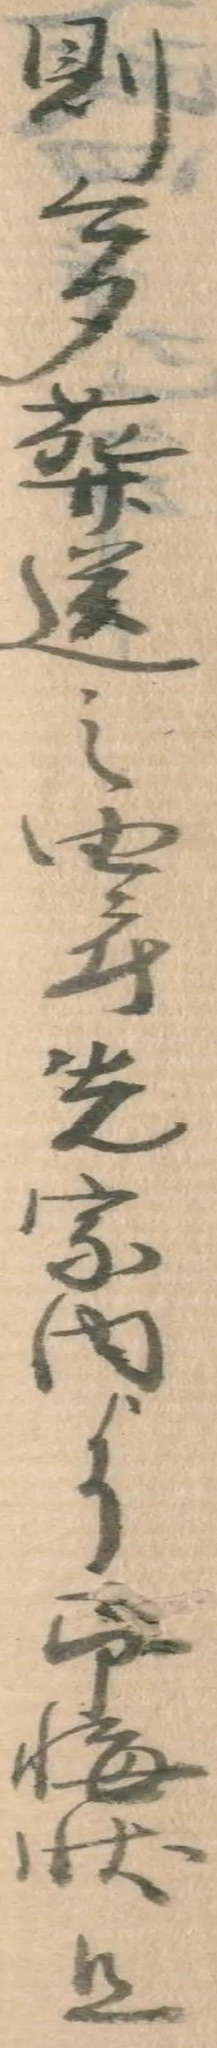則今夕葬送之由ニ付、先家内より予悔状、且
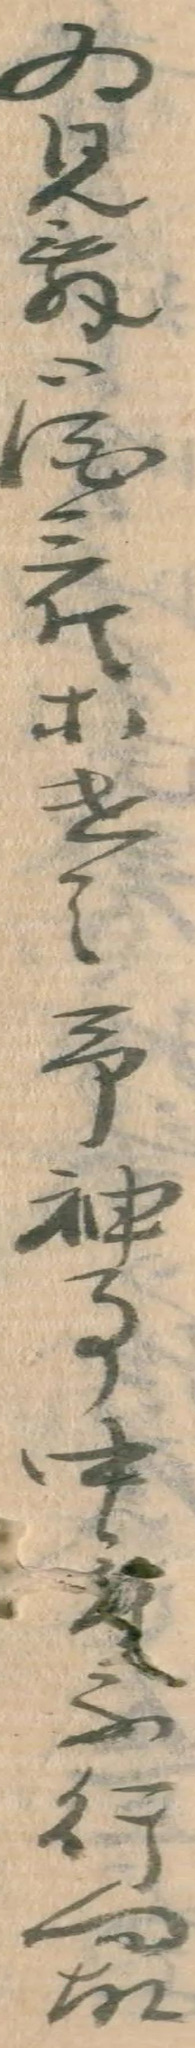為見舞御酒三升等遣之、予神事中之不行向故、
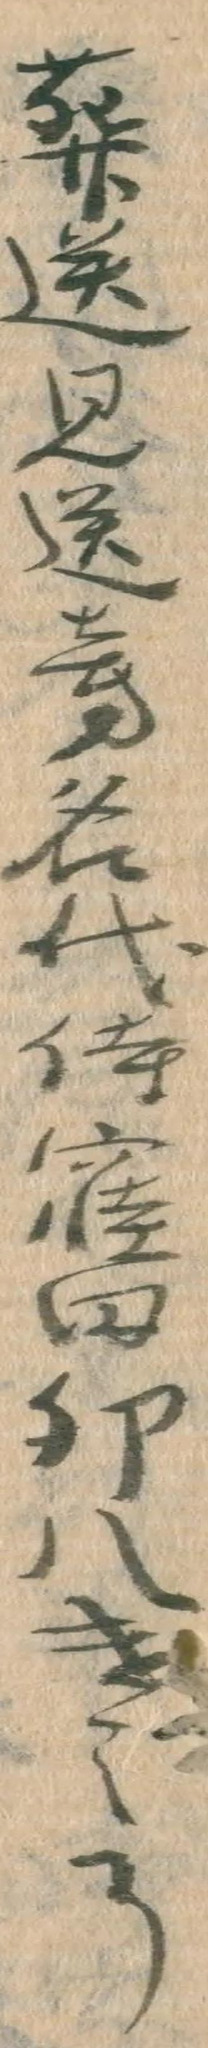葬送見送、旁名代侍寝田卯八遣之了、
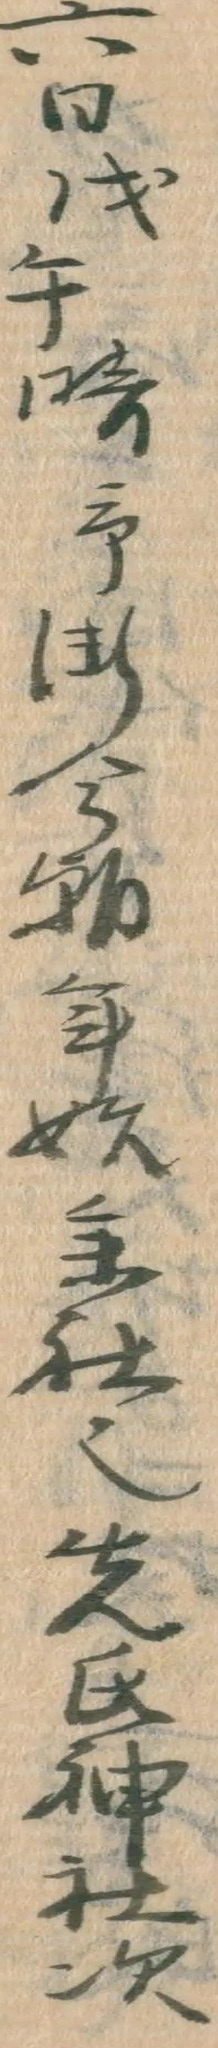六日戌午晴、予漸今朝年始参社也、先氏神社、次
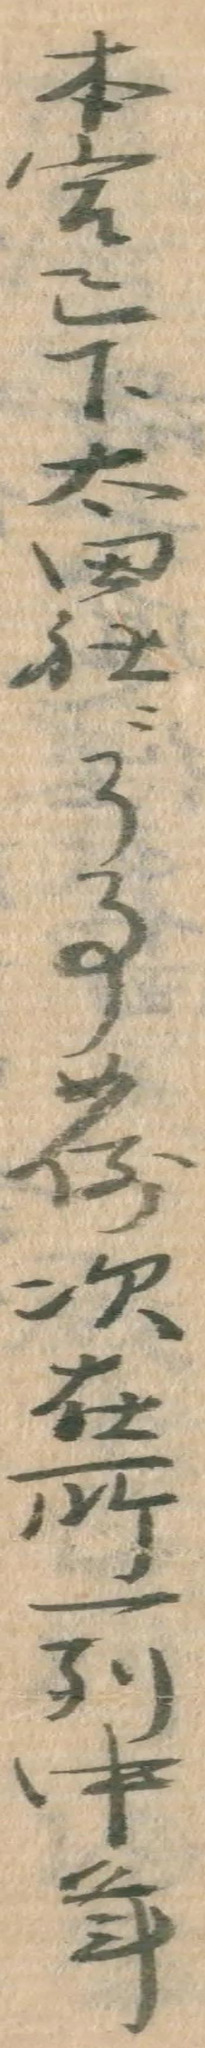本宮、已下太田社ニ候事如例、次在所一列中年
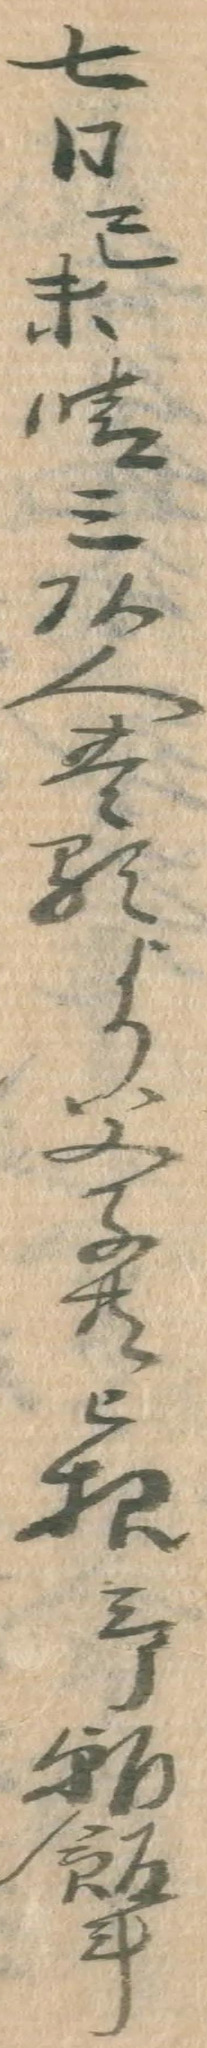七日己未晴、三頭人豊顕より、父子共被招、予朝飯計
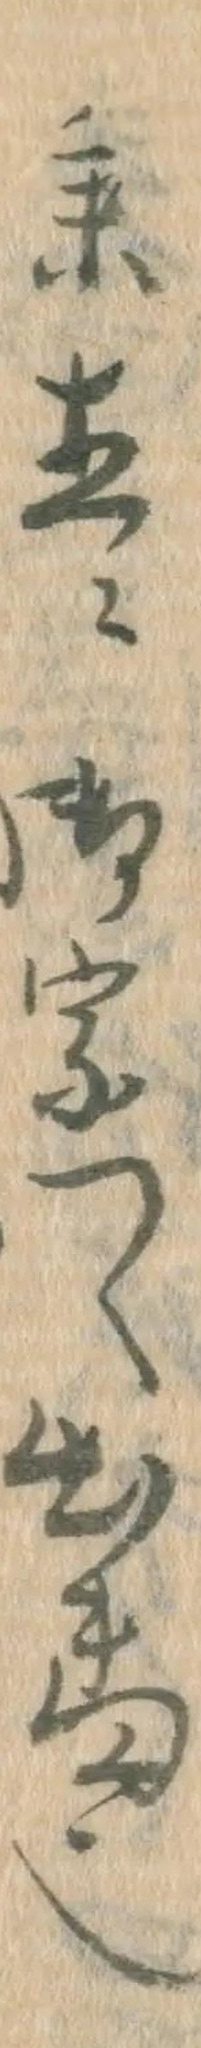参直ニ御家門へ出番也、
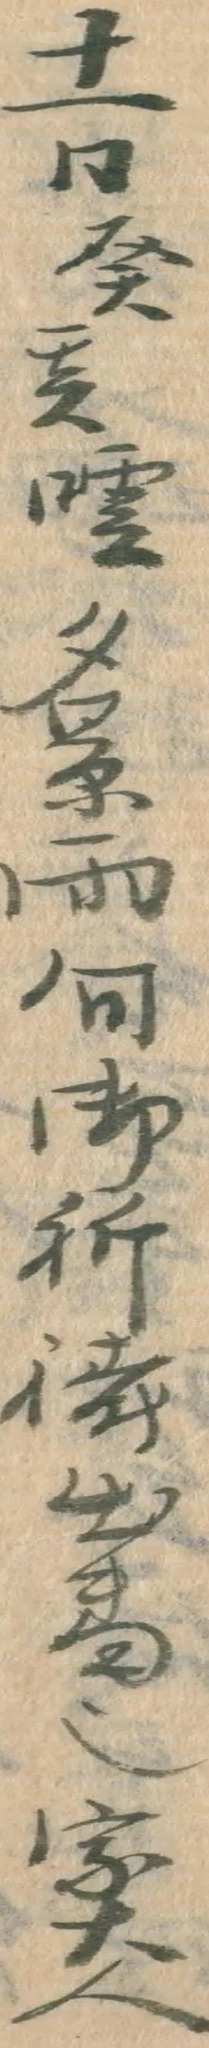十一日癸亥曇夕景雨、旬御祈祷出番也、家大人
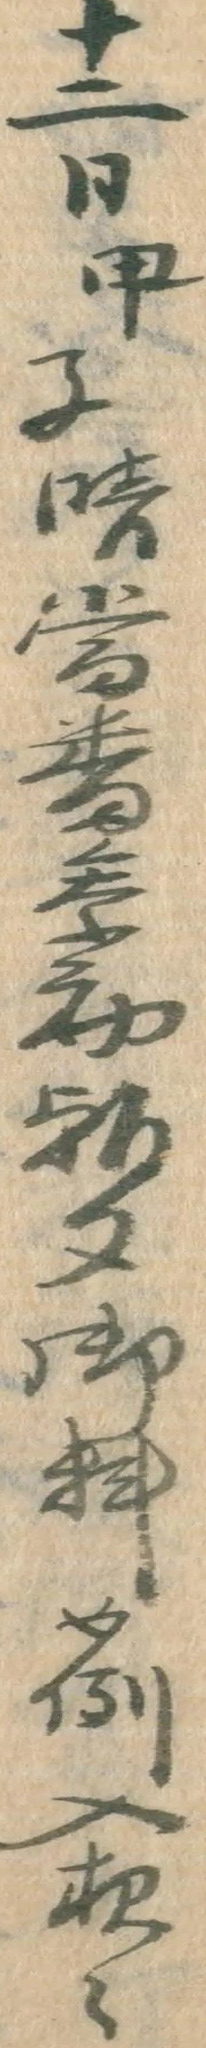十二日甲子晴、當番参勤、朝夕御料如例、入夜之
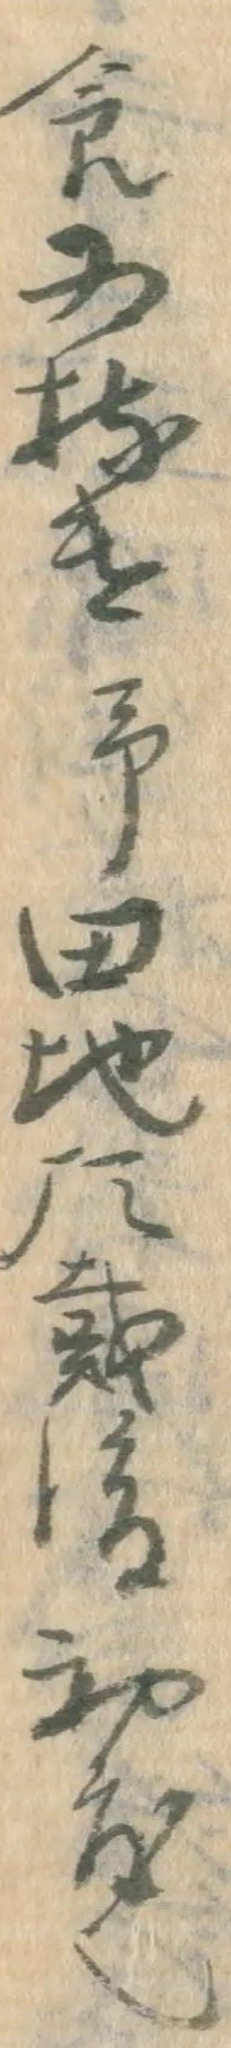食為持遣、予田地預戴後初度之、

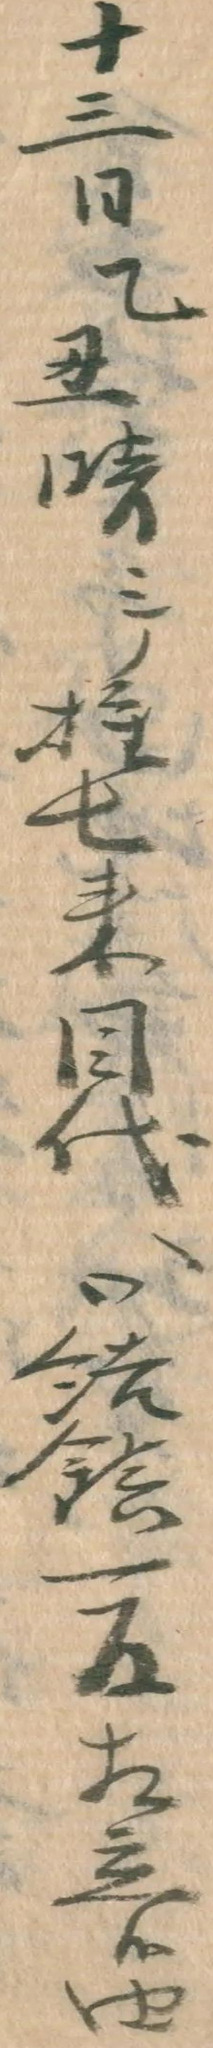十三日乙丑晴、シノ柱七来、目代へ御結鎮一反相立候由、
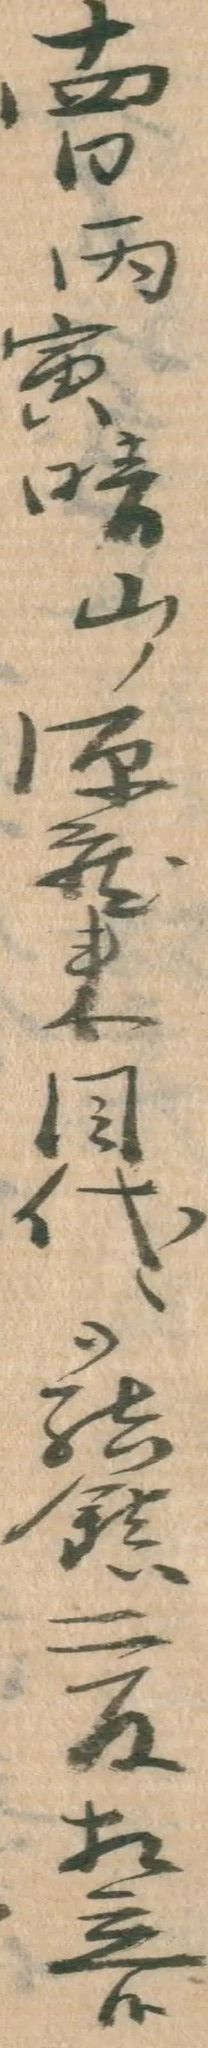十四日丙寅晴、山ノ源蔵来、目代へ御結鎮二反相立候
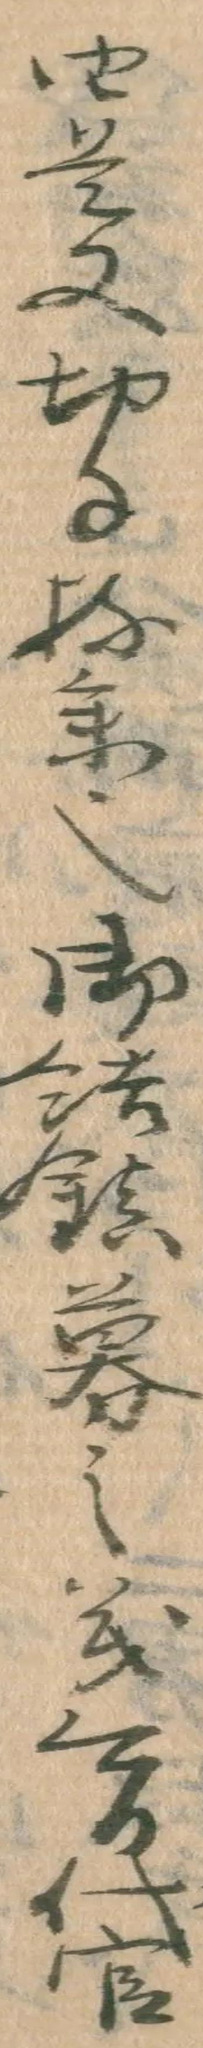由、是又切手持参也、御結鎮募之義、今日代官
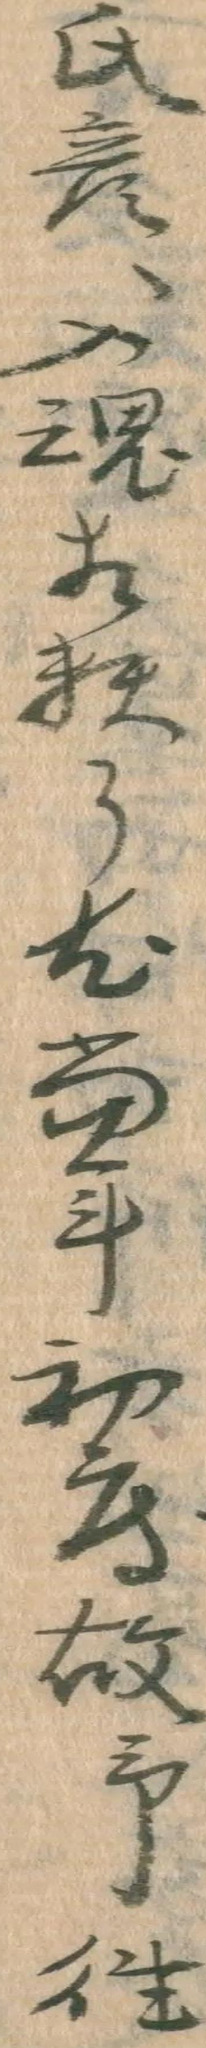氏彦へ入魂相頼了、尤當年初度故、予往
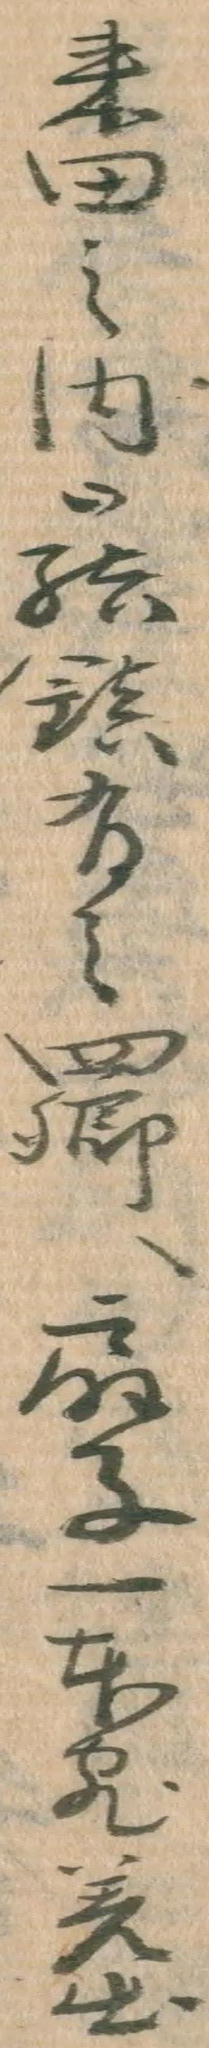来田之内御結鎮有之、四郷へ扇子一本宛差出
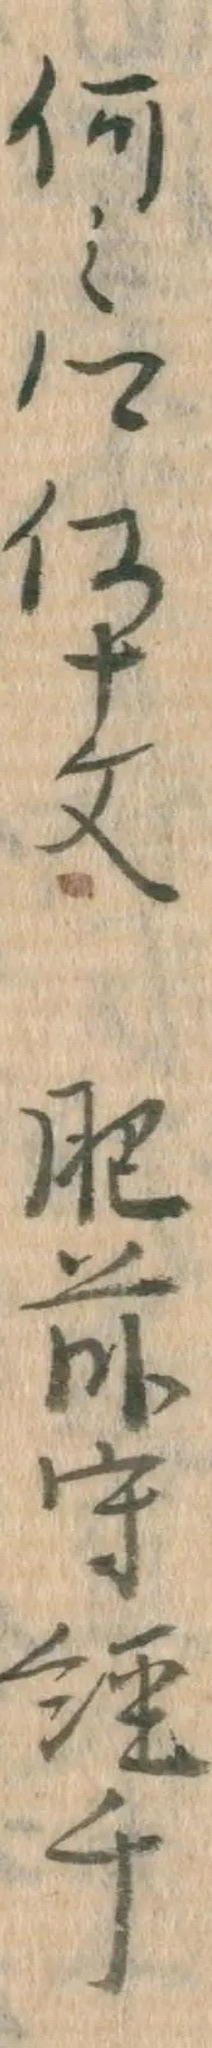何之郷何十文肥前守経千
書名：賀茂社記録. 第63冊
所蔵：国立国会図書館 National Diet Library, JAPAN
